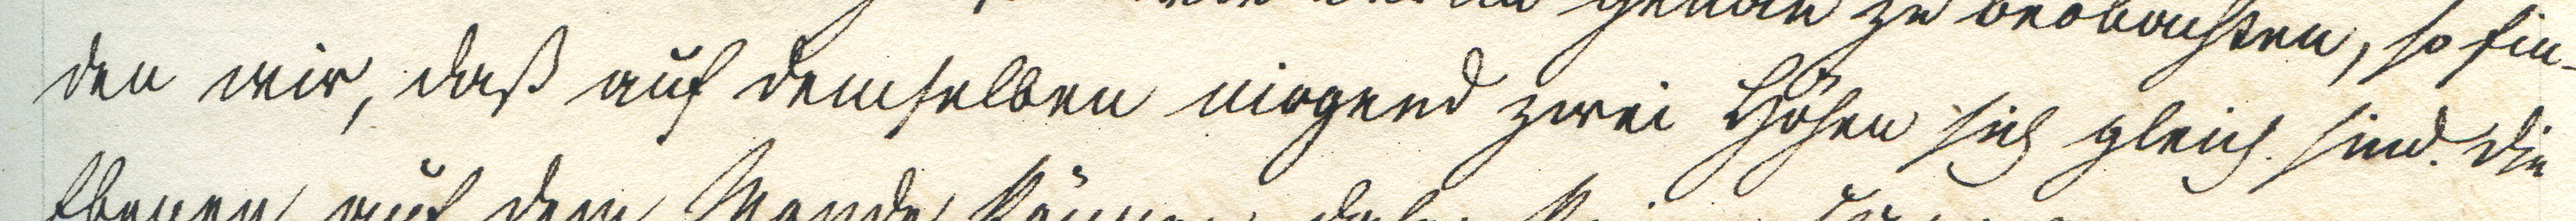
den wir, daß auf demselben nirgend zwei Höhen sich gleich sind. Die
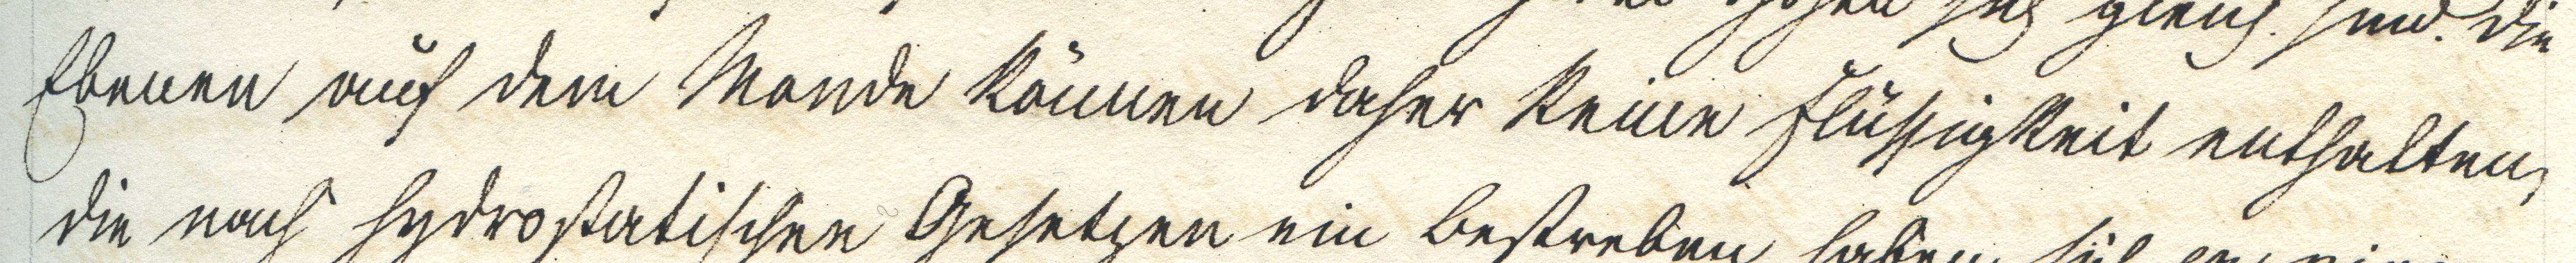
Ebenen auf dem Monde können daher keine Flüssigkeit enthalten,
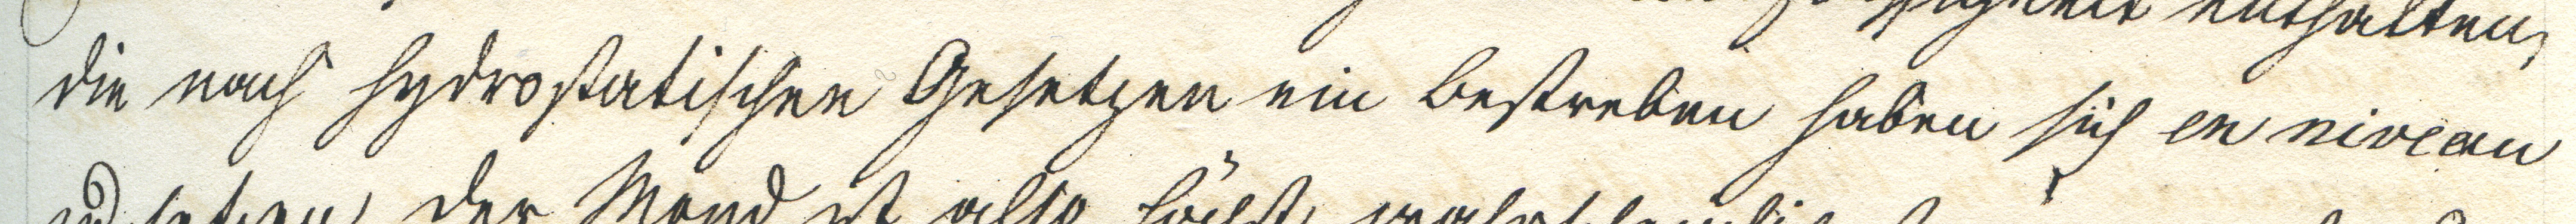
die nach hydrostatischen Gesetzen ein Bestreben haben sich en niveau
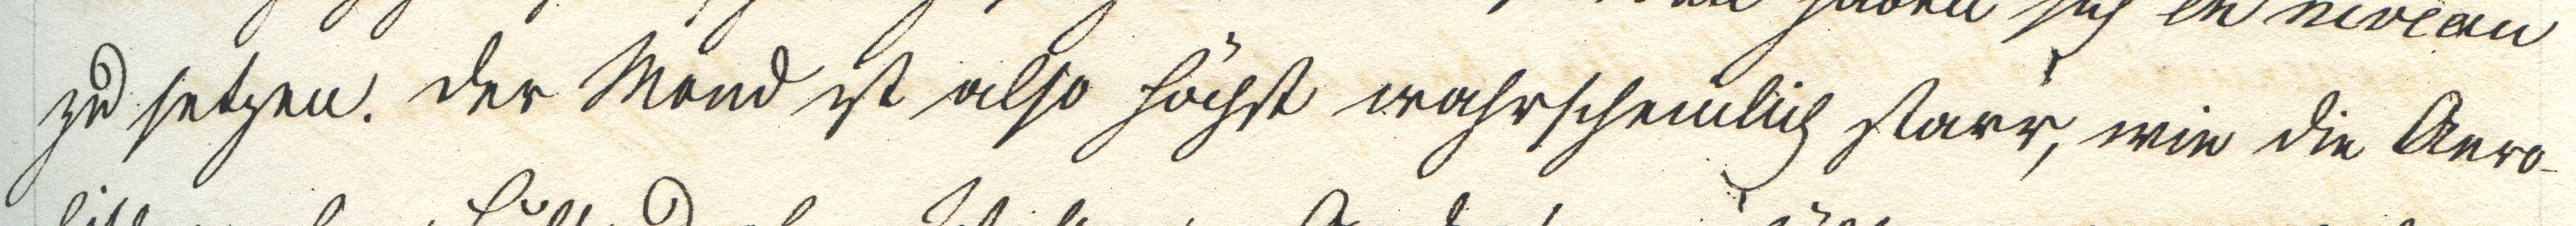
zu setzen. Der Mond ist also höchst wahrscheinlich starr, wie die Aero-
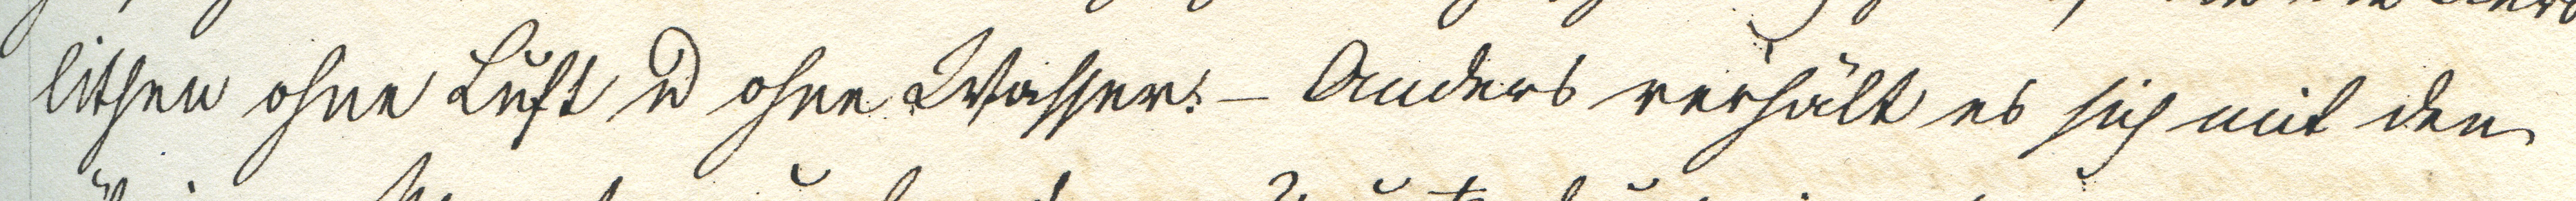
lithen ohne Luft u ohne Wasser. – Anders verhält es sich mit den
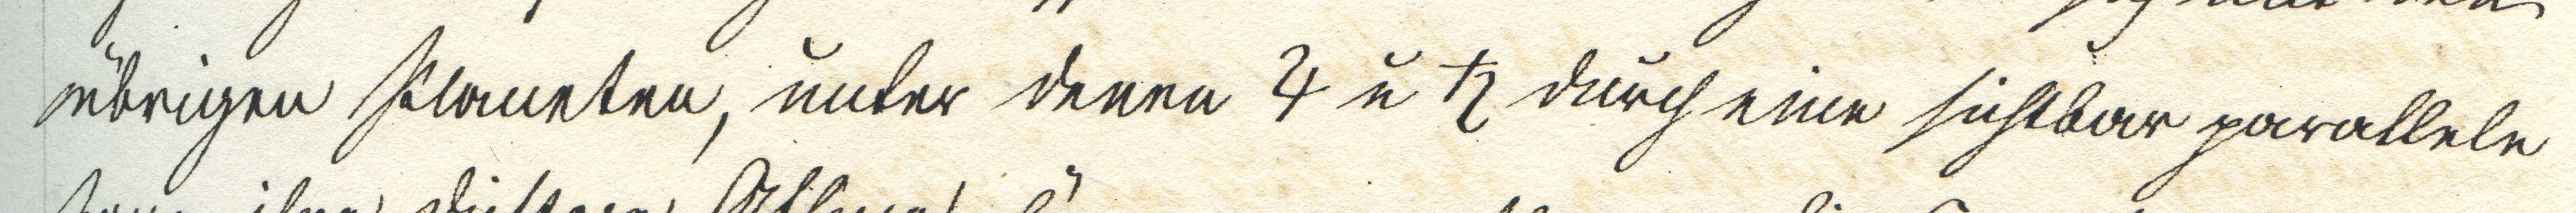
übrigen Planeten, unter denen ♃ u ♄ durch eine sichtbare parallele
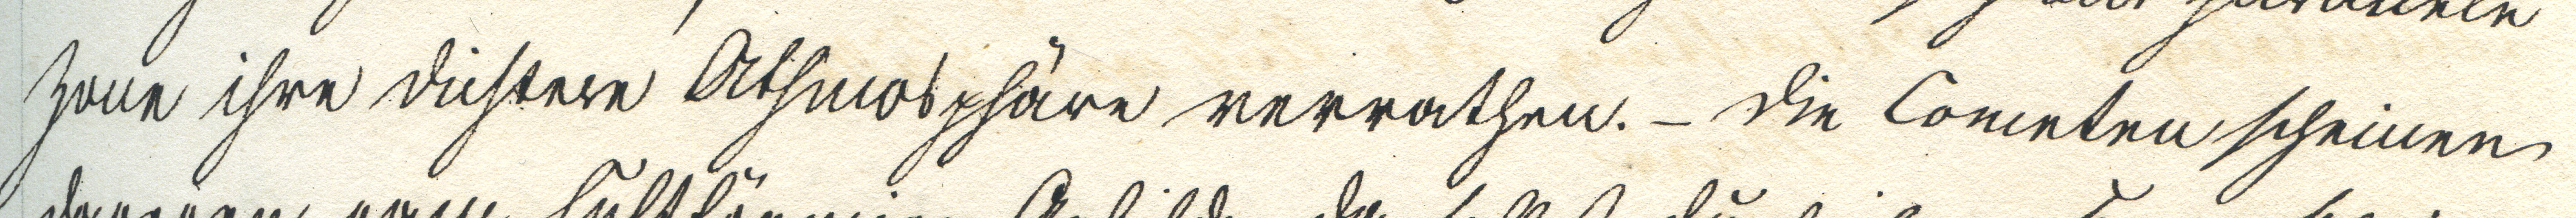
Zone ihre dichtere Athmosphäre verrathen. – Die Cometen scheinen
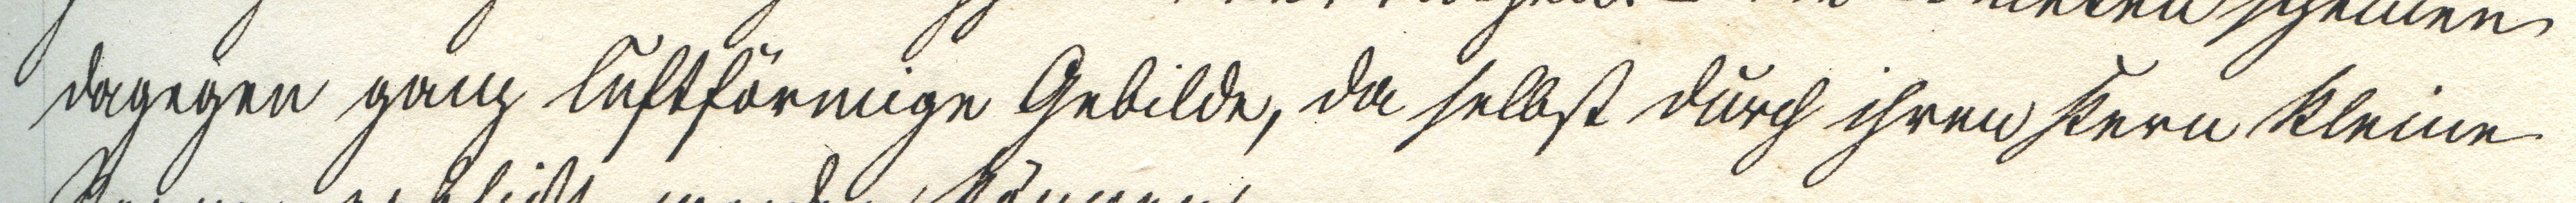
dagegen ganz luftförmige Gebilde, da selbst durch ihren Kern kleine
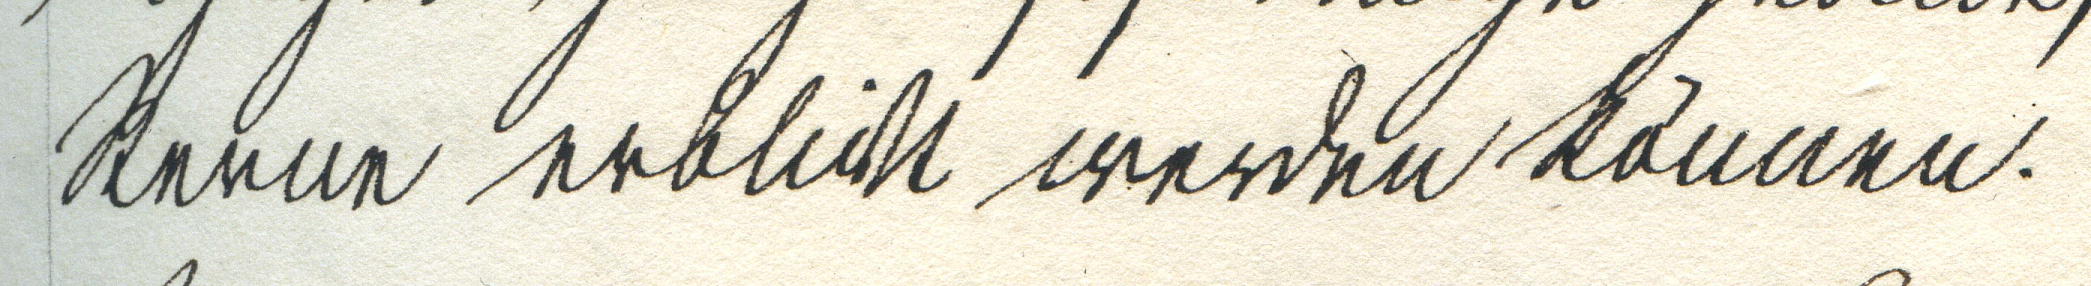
Sterne erblickt werden können.
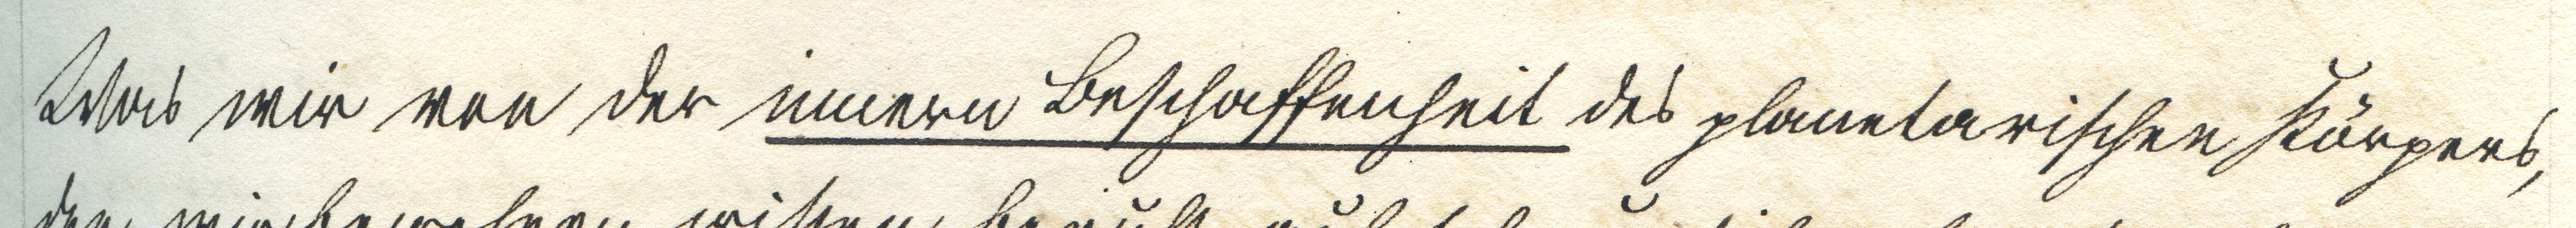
Was wir von der innern Beschaffenheit des planetarischen Körpers,
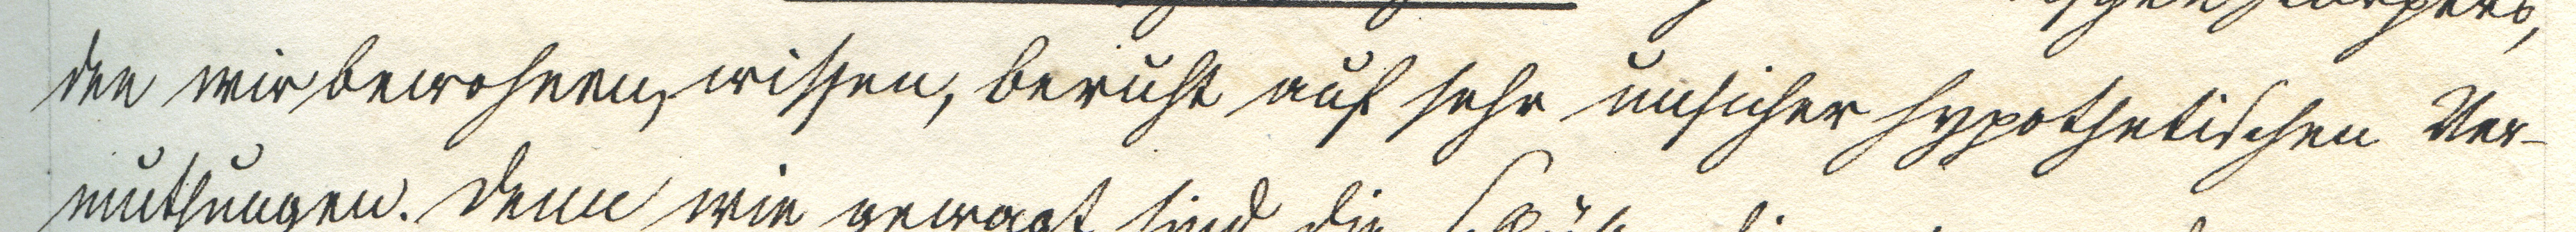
den wir bewohnen, wissen, beruht auf sehr unsicher hypothetischen Ver-
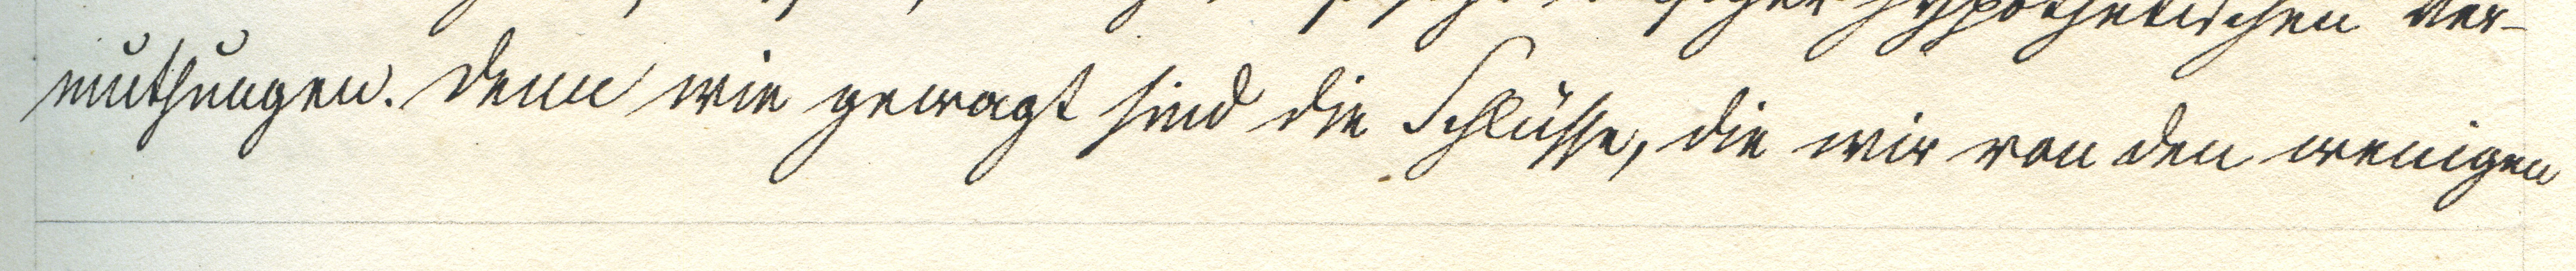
muthungen. Denn wie gewagt sind die Schlüsse, die wir von den wenigen
